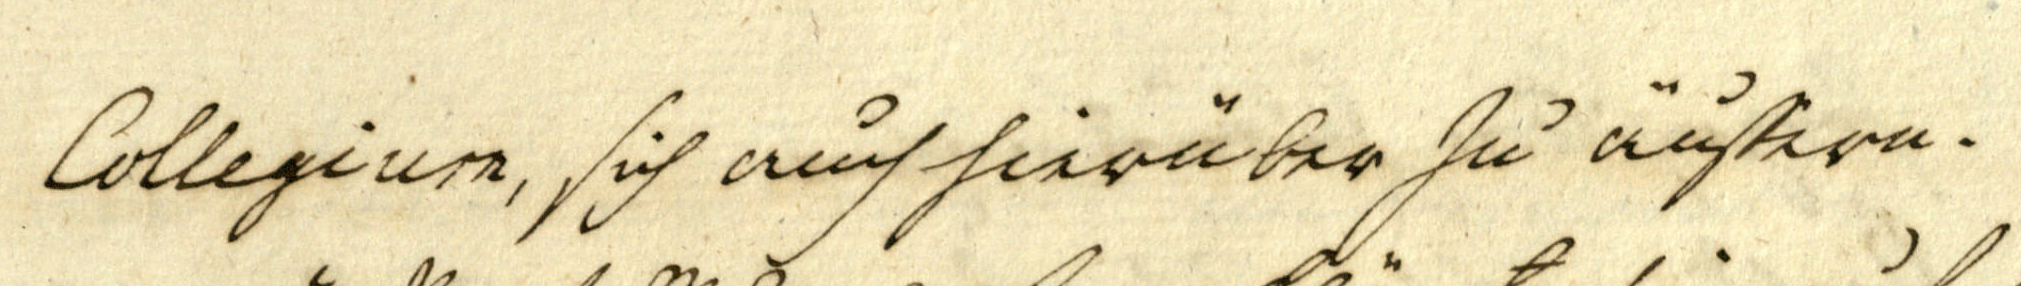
Collegium, sich auch hierüber zu äussern.
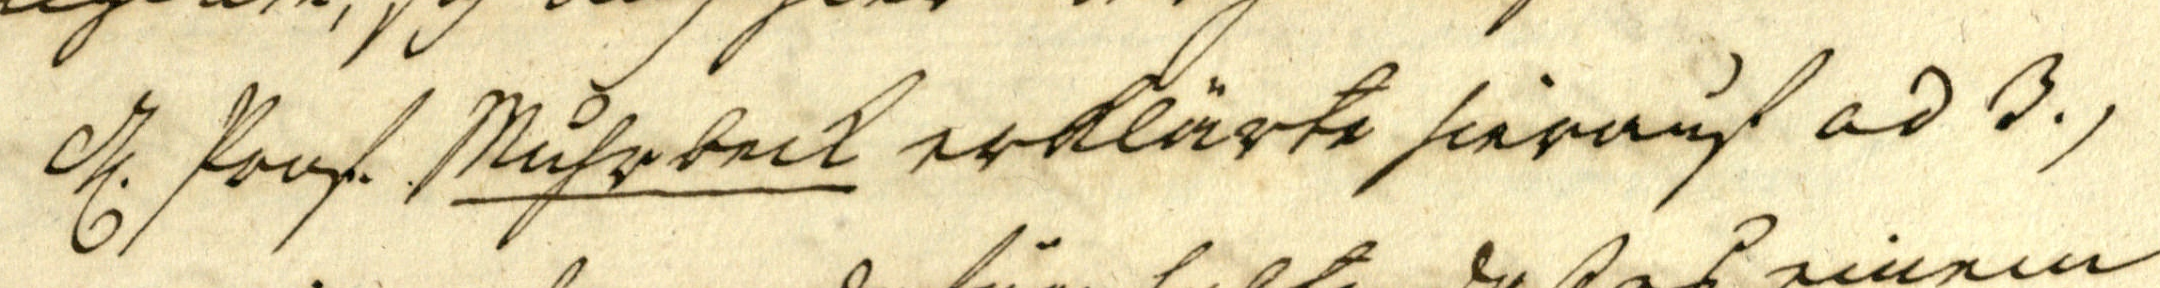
dh. Prof. Muhrbeck erklärte hierauf ad 3.,
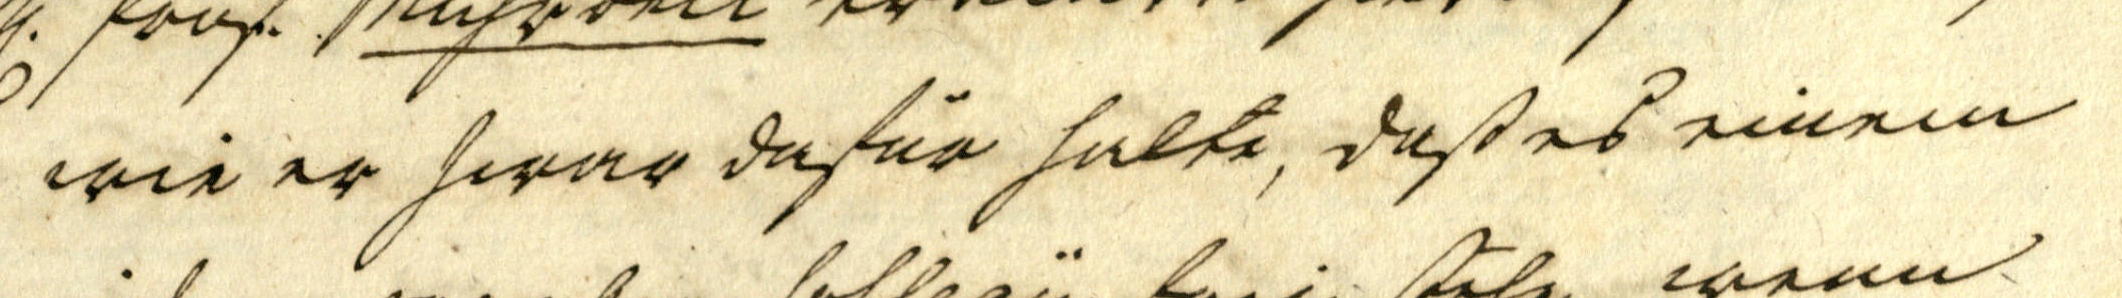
wie er zwar dafür halte, daß es einem
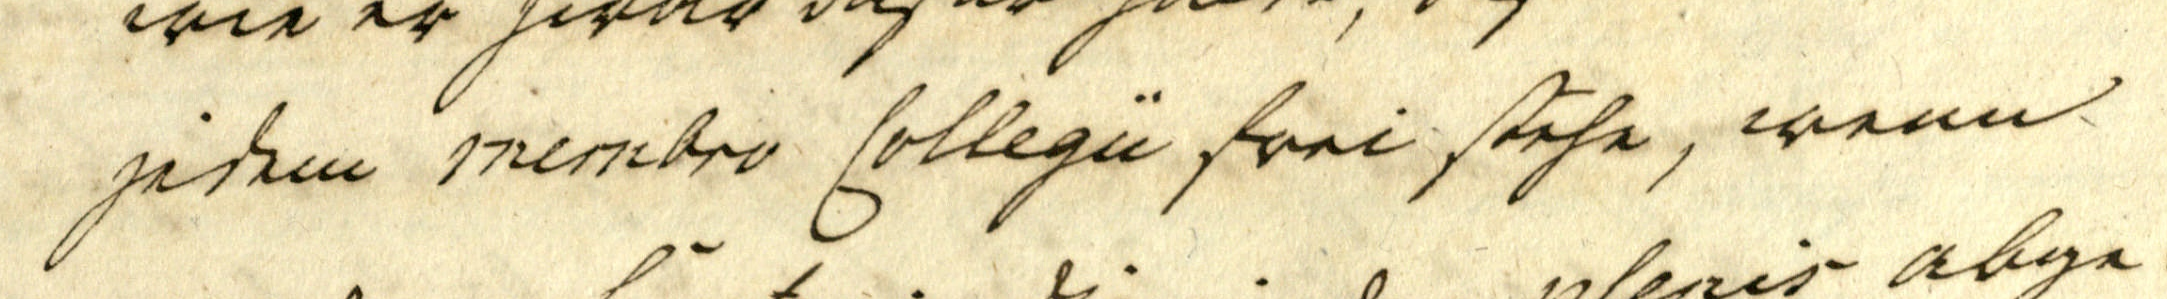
jedem membro Collegii frei stehe, wenn
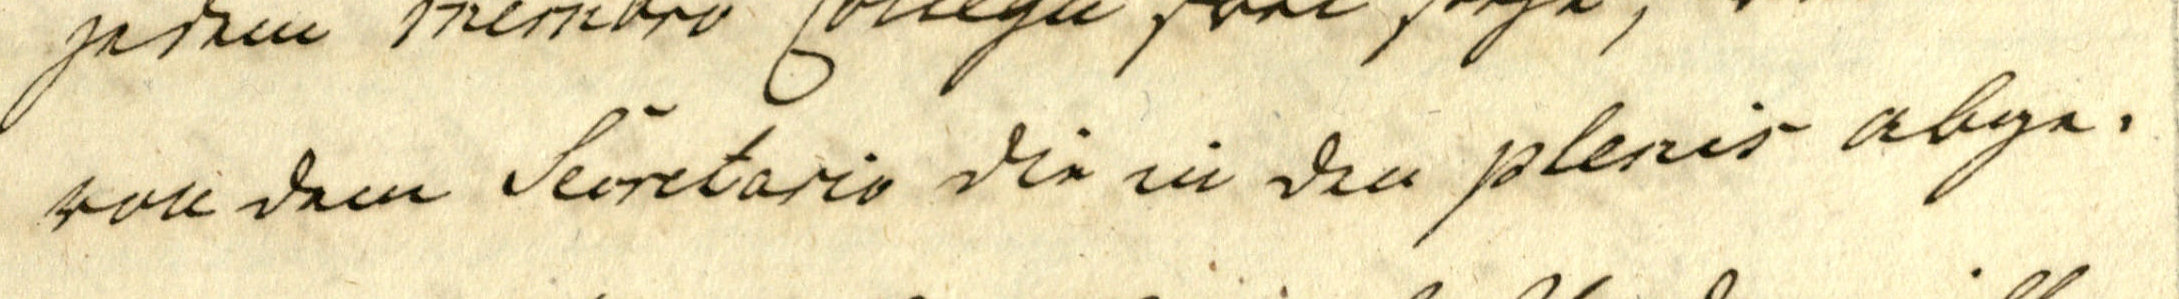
von dem Secretario die in den plenis abge¬
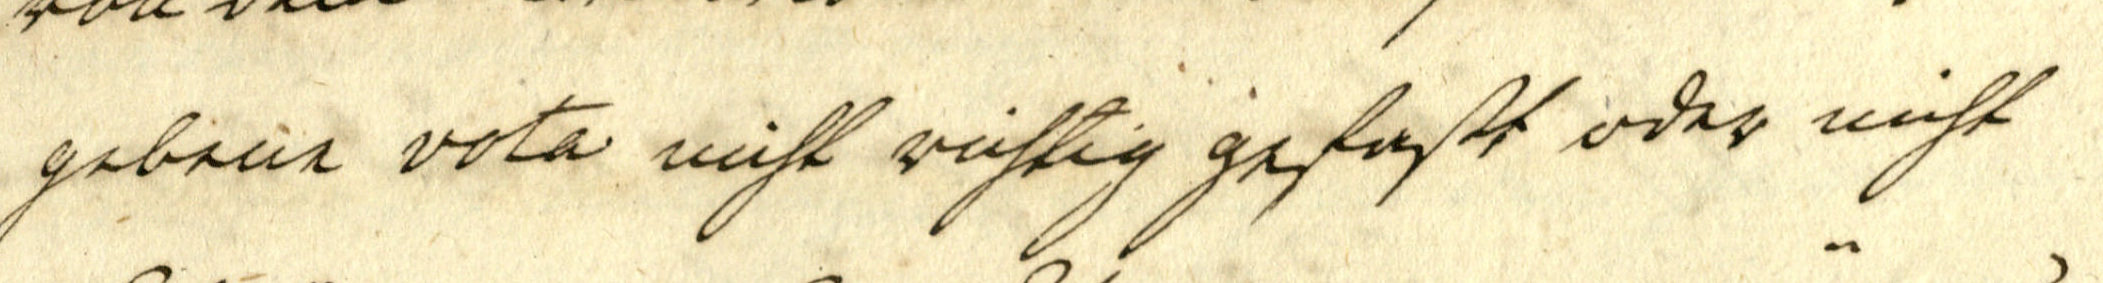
gebene vota nicht richtig gefaßt oder nicht
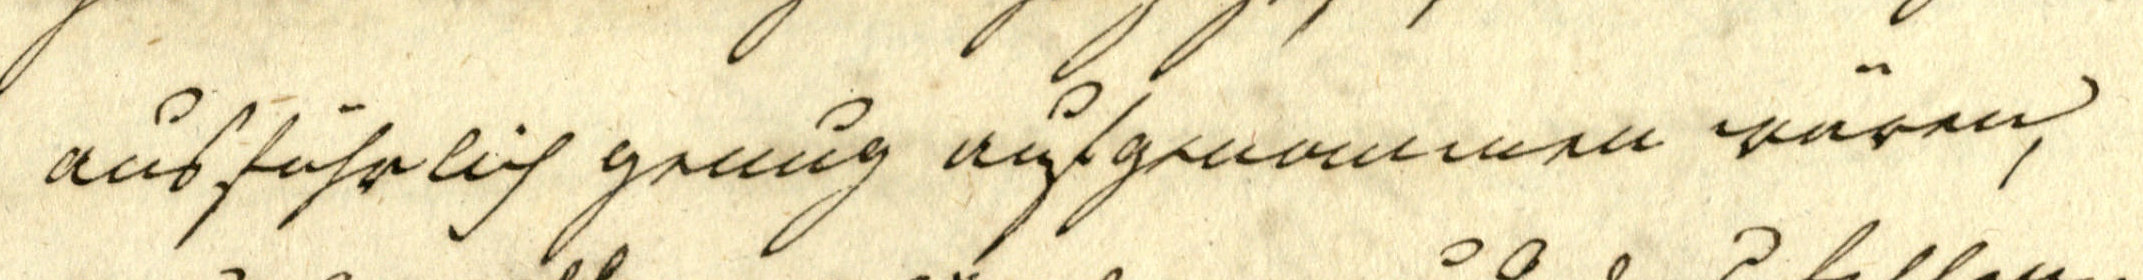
ausführlich genug aufgenommen wären,
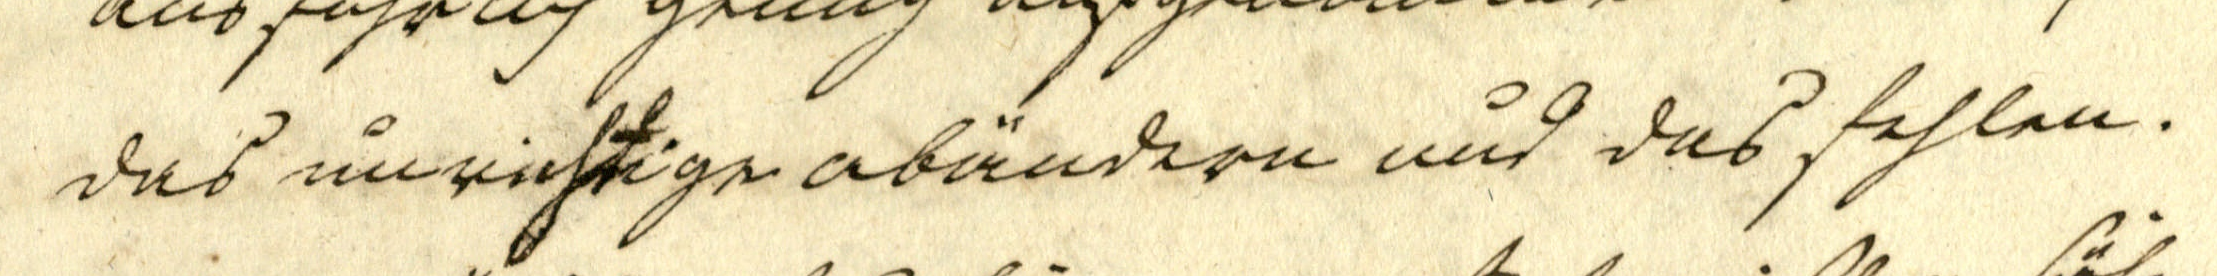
das unrichtige abändern und das fehlen¬
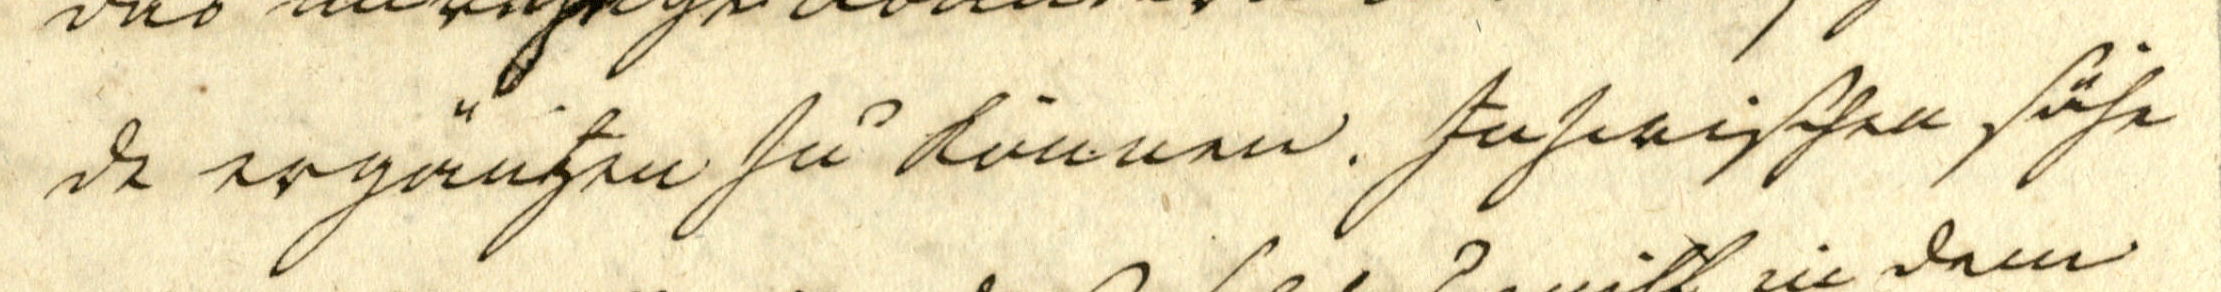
de ergäntzen zu können. Inzwischen sähe
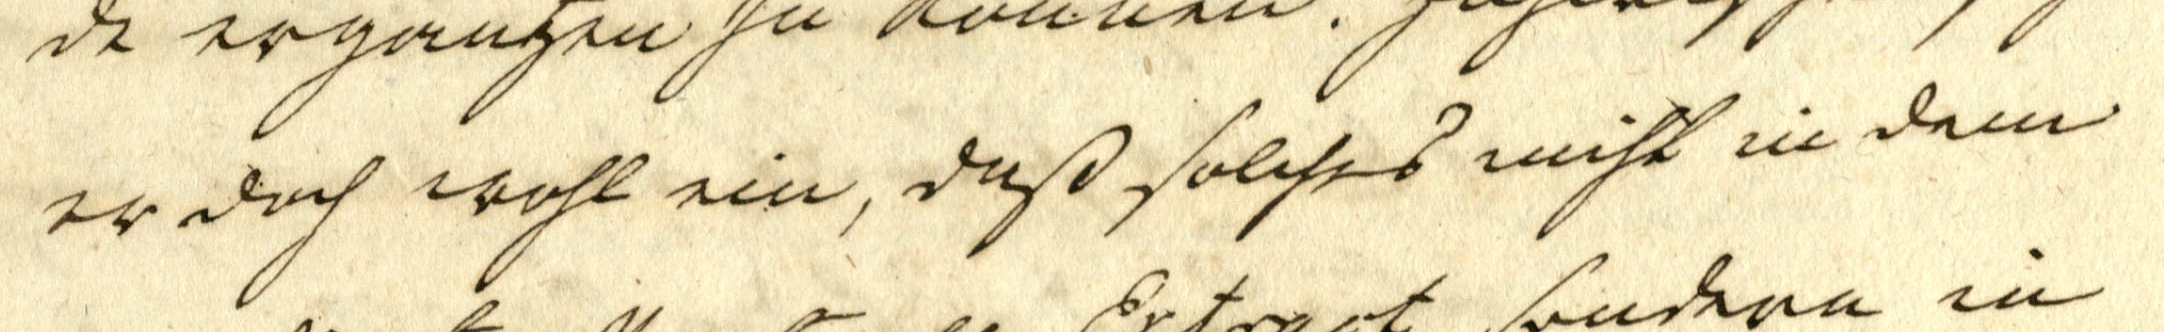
er doch wohl ein, daß solches nicht in dem
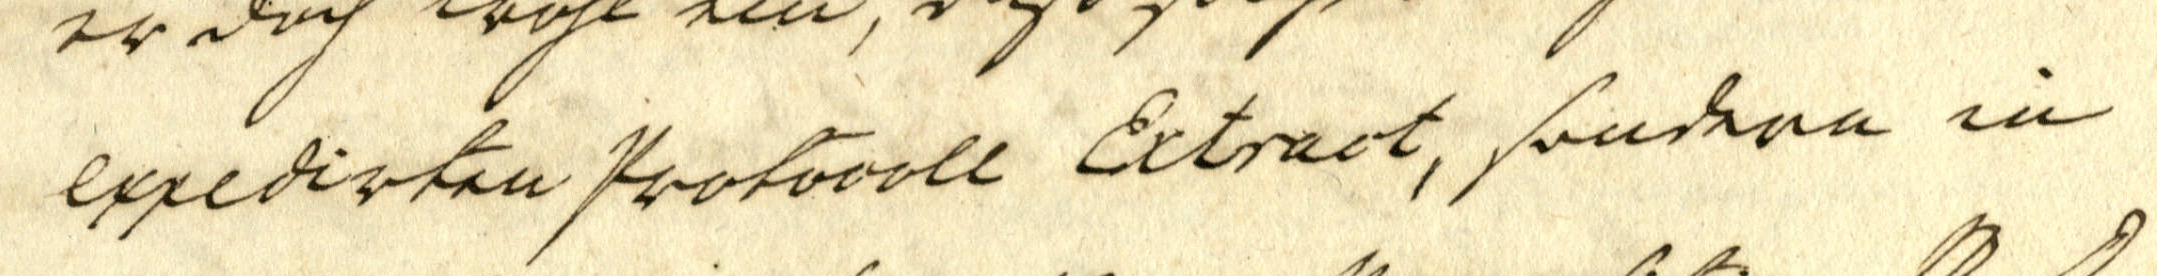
expedirten Protocoll Extract, sondern in
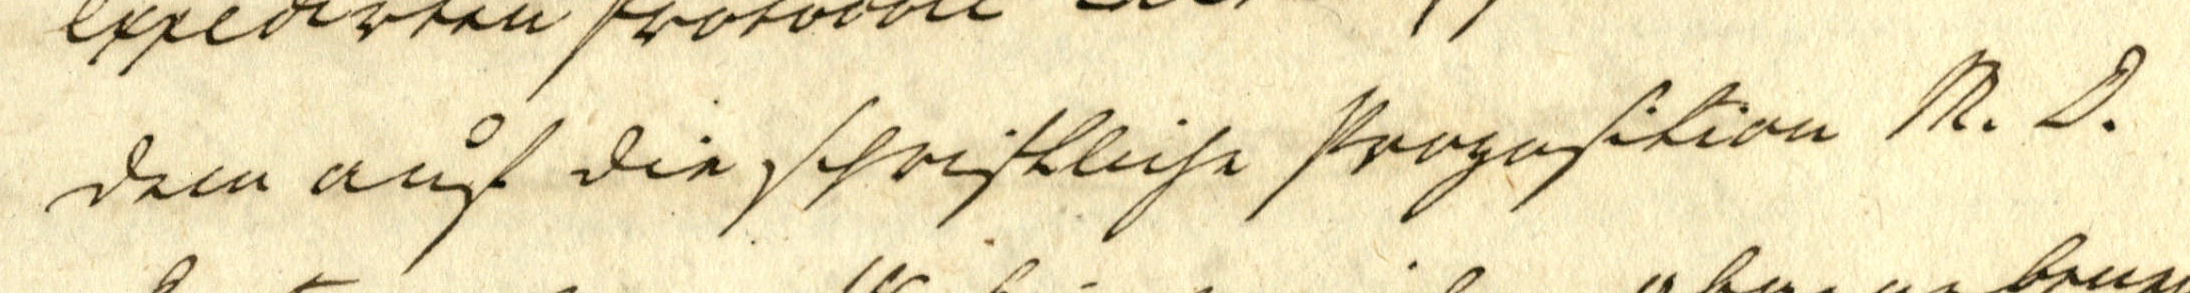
dem auf die schriftliche Proposition M. D.
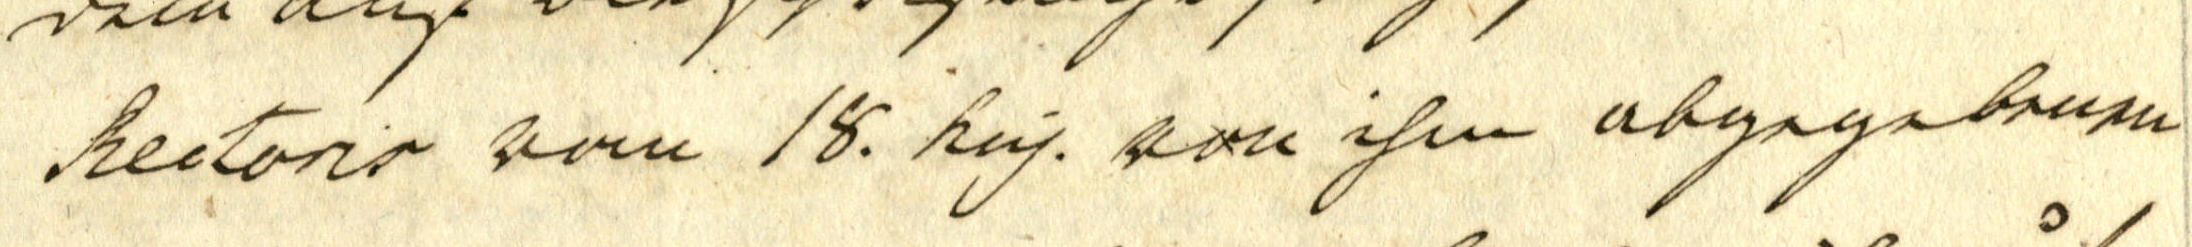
Rectoris vom 18. huj. von ihm abgegebenen
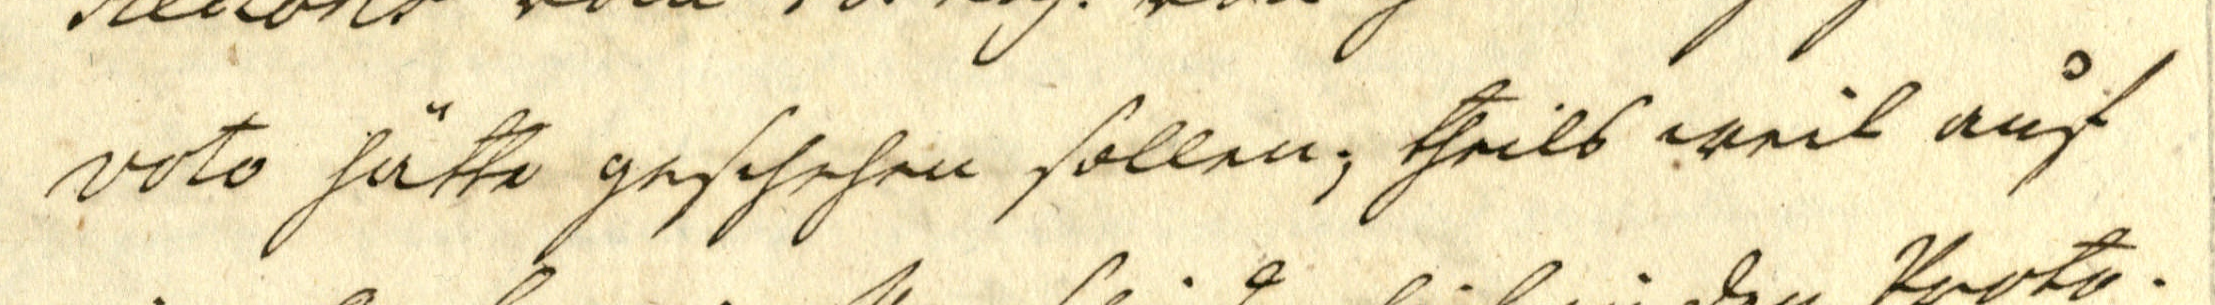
voto hätte geschehen sollen; theils weil auf
